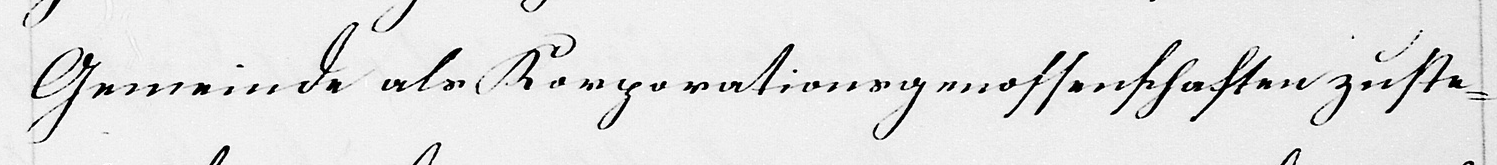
Gemeinde als Korporationsgenossenschaften zuste¬
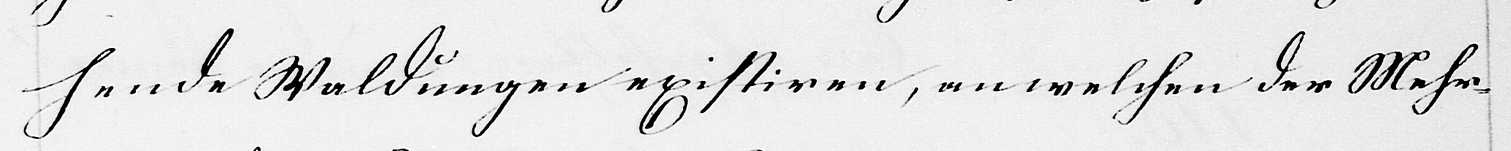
hende Waldungen existiren, an welchen der Mehr¬
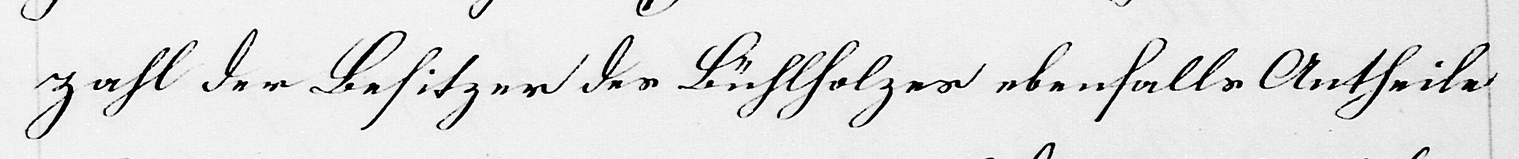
zahl der Besitzer des Bühlholzes ebenfalls Antheile
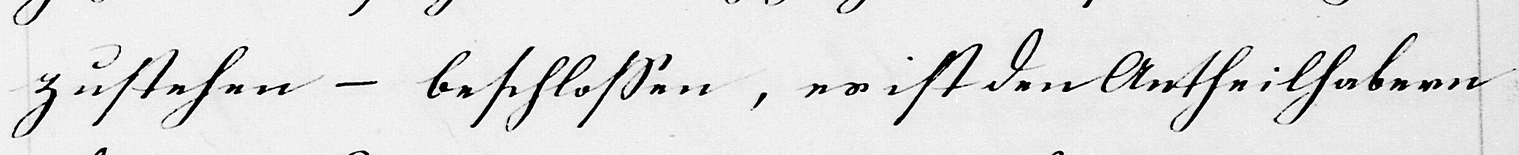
zustehen – beschloßen, es ist den Antheilhabern
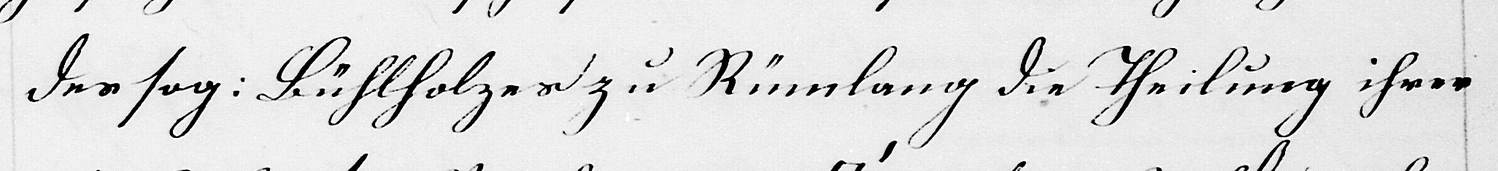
des sog: Bühlholzes zu Rümlang die Theilung ihrer
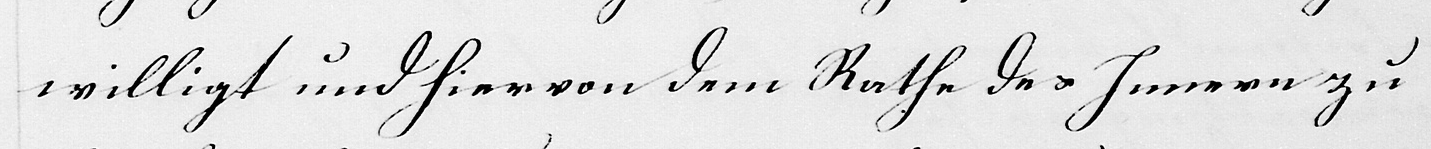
willigt und hiervon dem Rathe des Innern zu
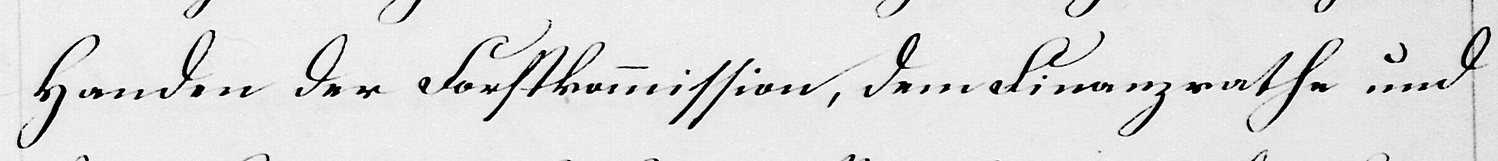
Handen der Forstkommission, dem Finanzrathe und
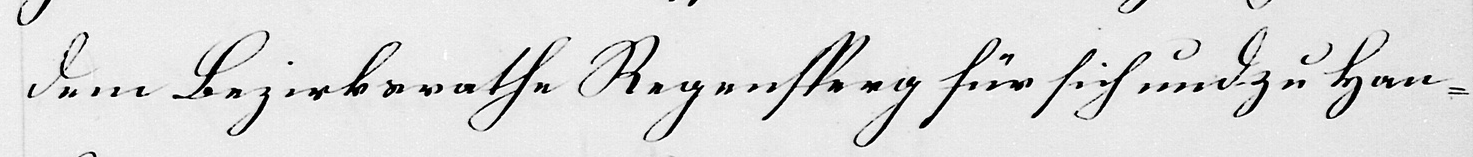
dem Bezirksrathe Regensperg für sich und zu Han¬
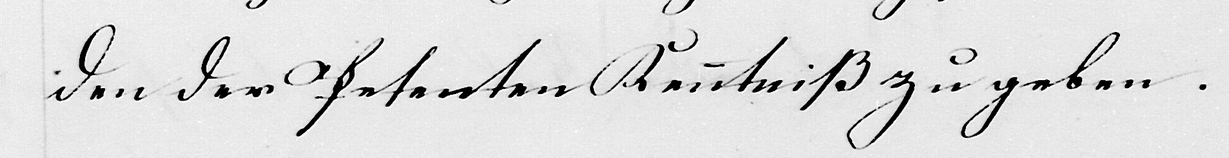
den der Petenten Kenntniß zu geben.
